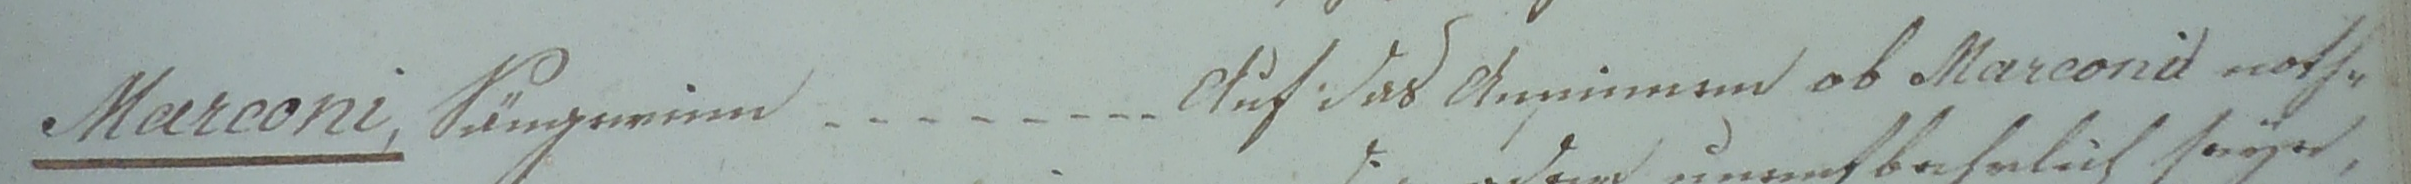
Marconi, Sängerinn …….. Auf das Ansinnen ob Marconi noth¬
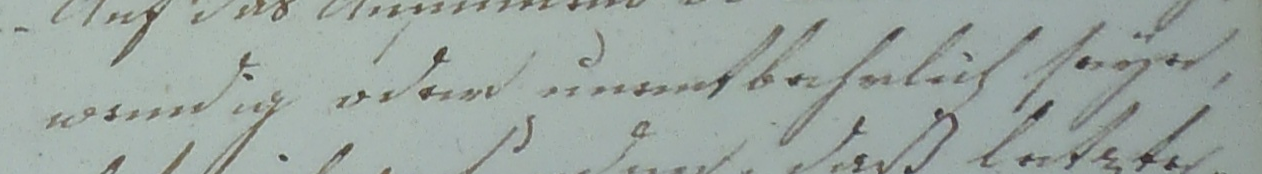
wendig oder unentbehrlich seye,
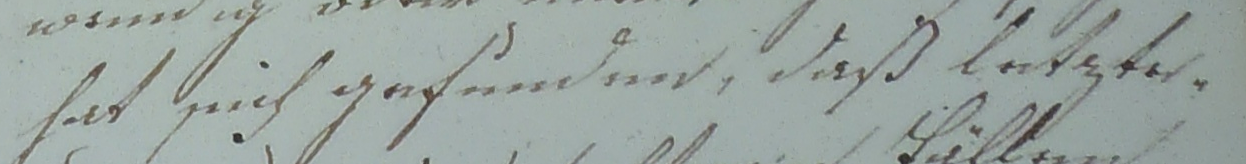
hat sich gefunden, daß letzte¬
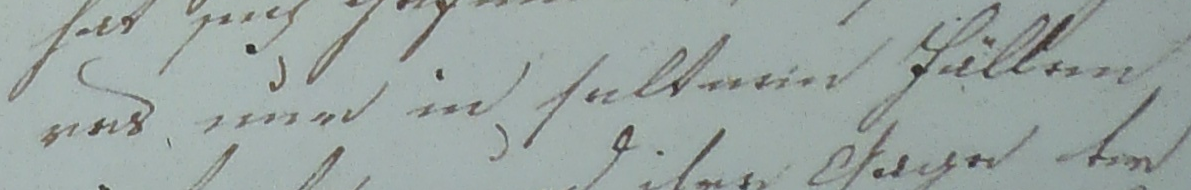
res nur in seltnen Fällen
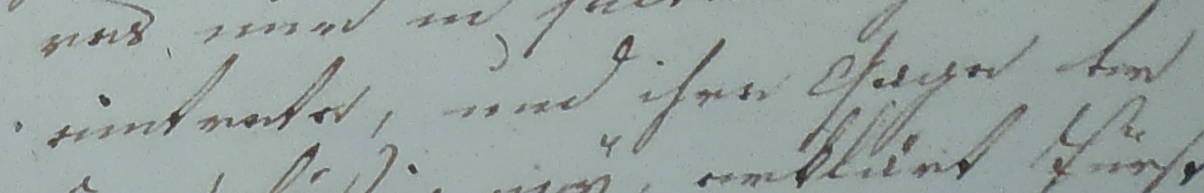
eintrete, und ihre Gage der
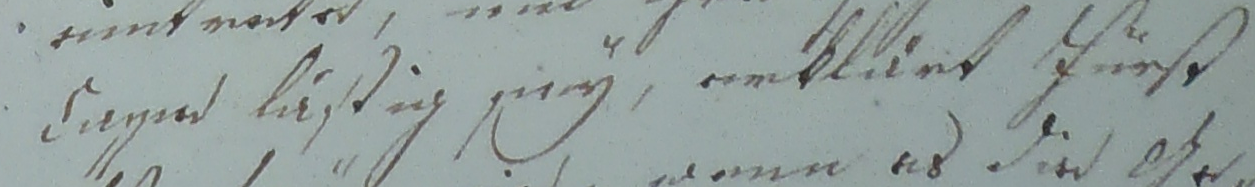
Casse lästig sey, erklärt Fürst
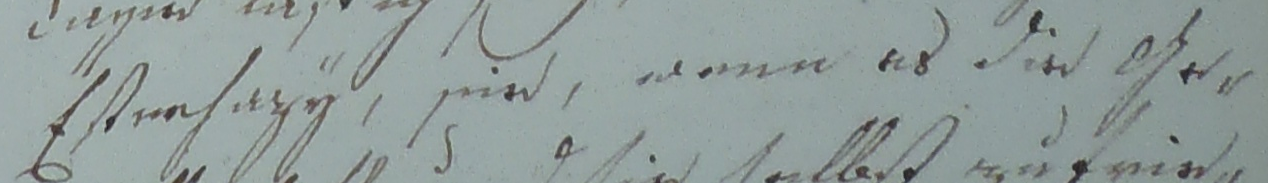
Esterhazy, sie, wenn es die Ge¬
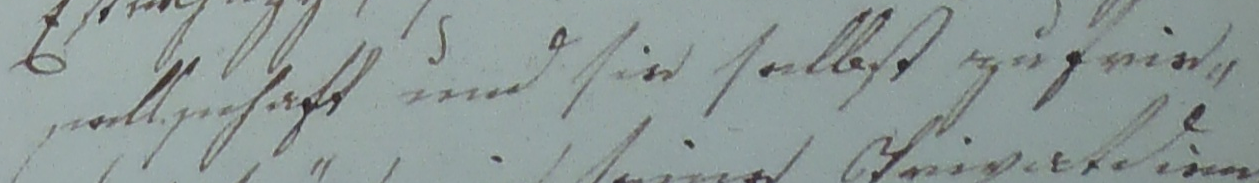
sellschaft und sie selbst zufrie¬
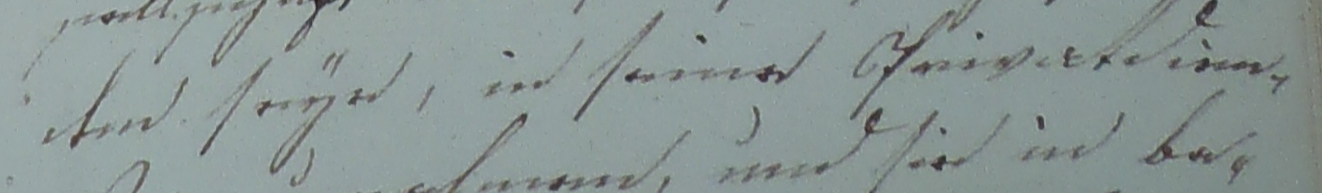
den seye, in seine Privatdien¬
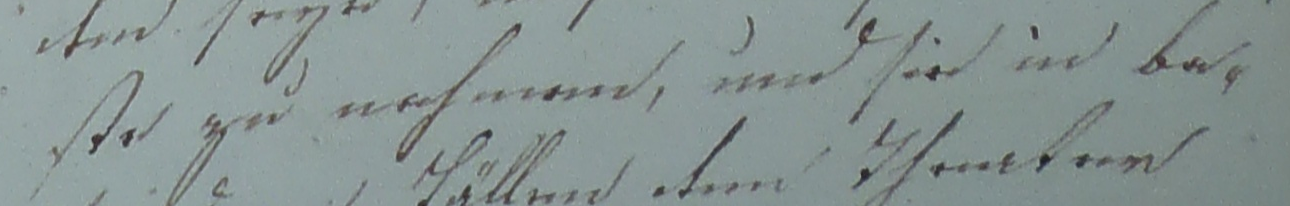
ste zu nehmen, und sie in be¬
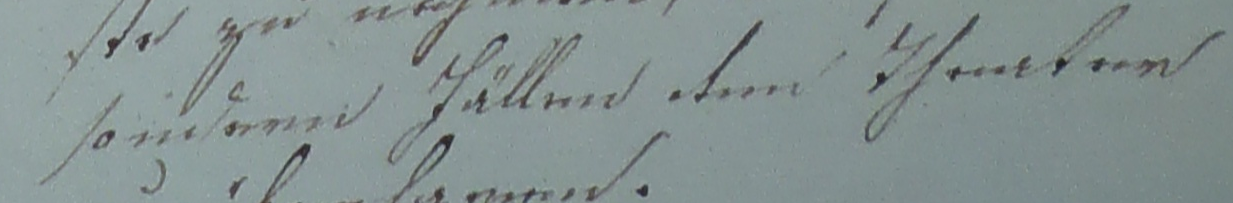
sondern Fällen dem Theater
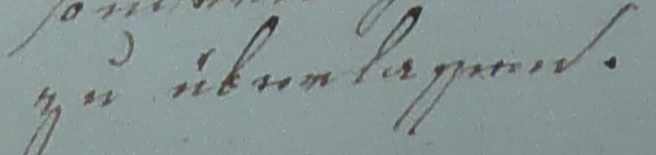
zu überlassen.
